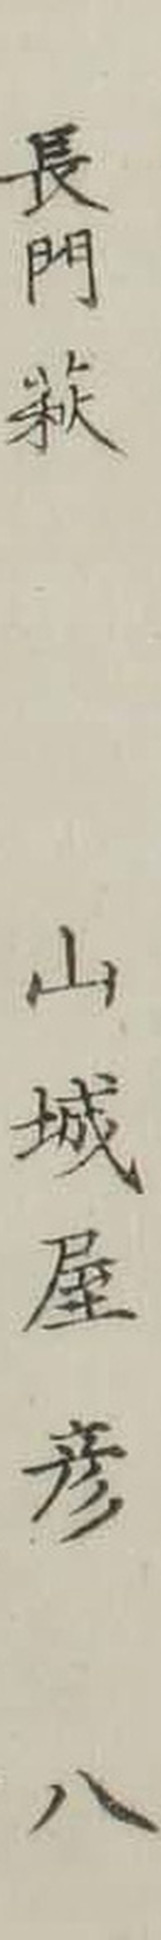長門萩山城屋彦八
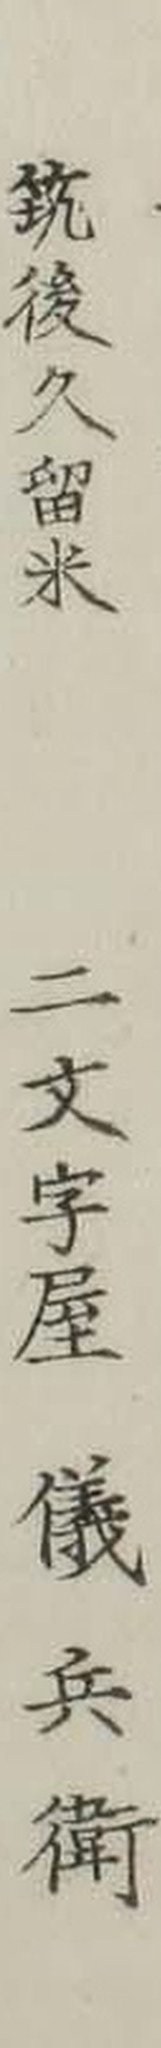筑後久留米二文字屋儀兵衛
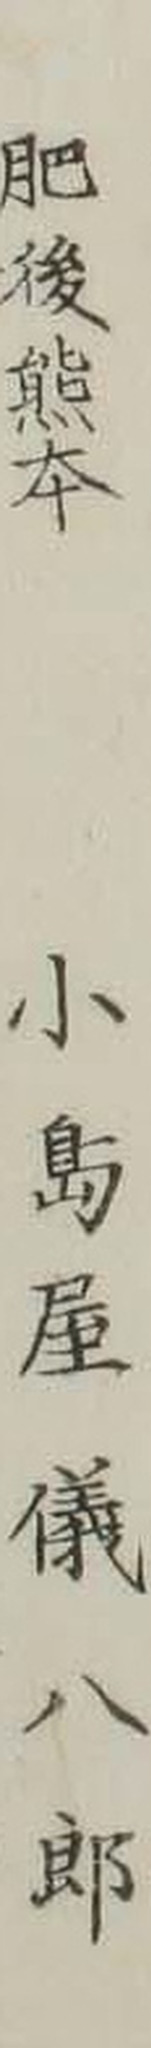肥後熊本小島屋儀八郎
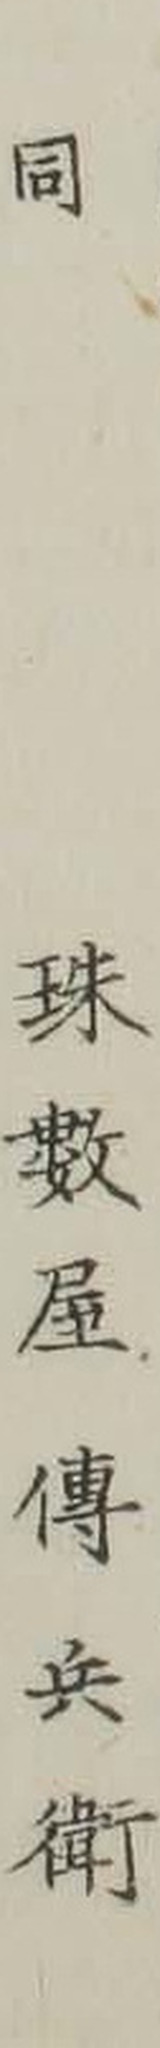同珠数屋傳兵衛
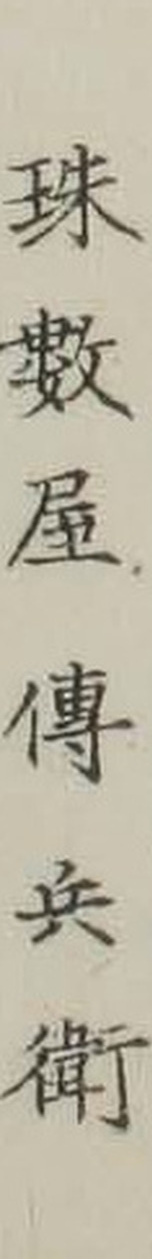同珠数屋傳兵衛
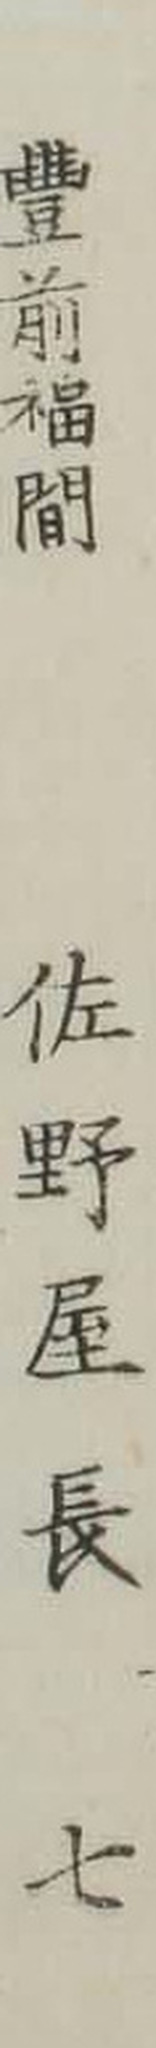豊前福間佐野屋長七
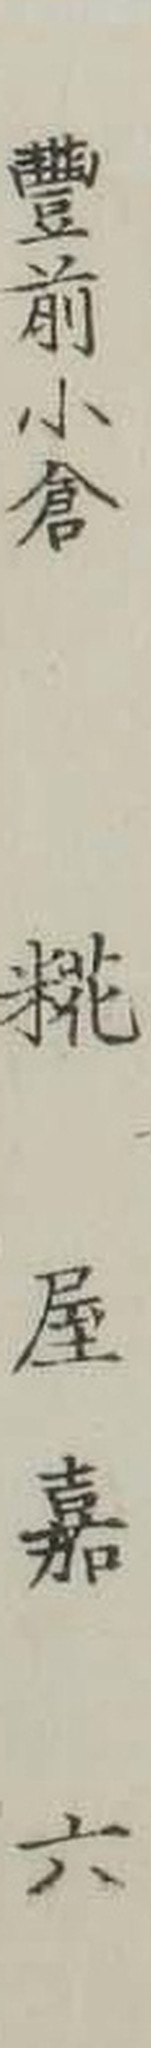豊前小倉糀屋嘉六
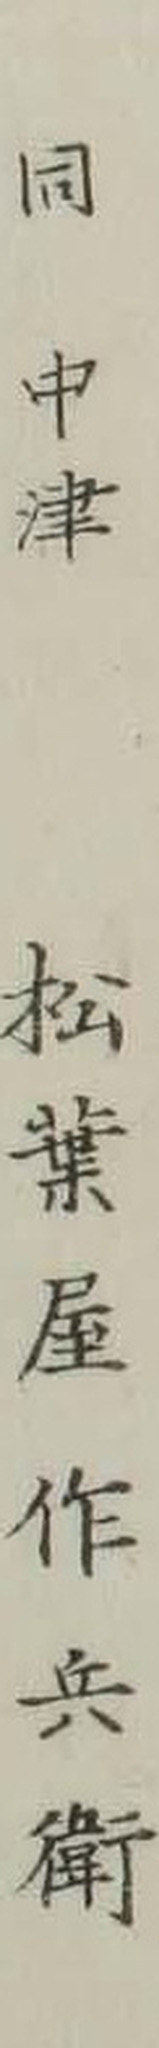同中津松葉屋作兵衛
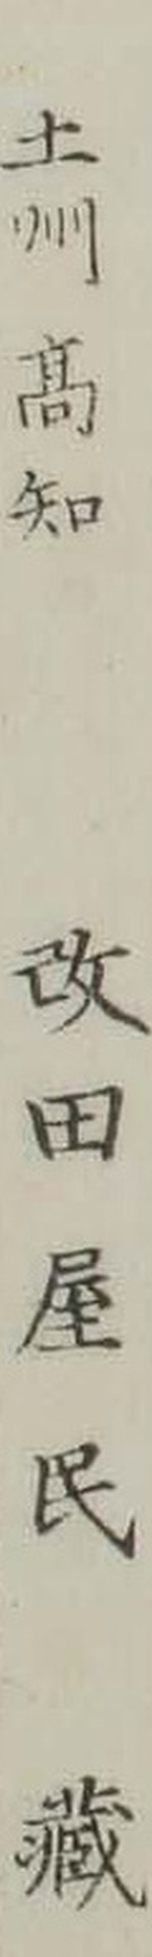土州高知改田屋民蔵

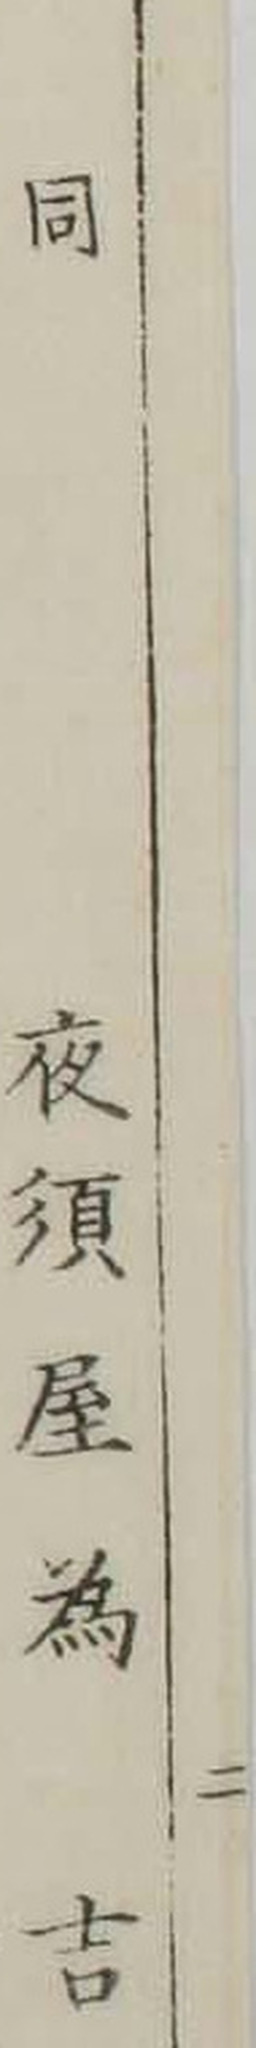同夜須屋為吉
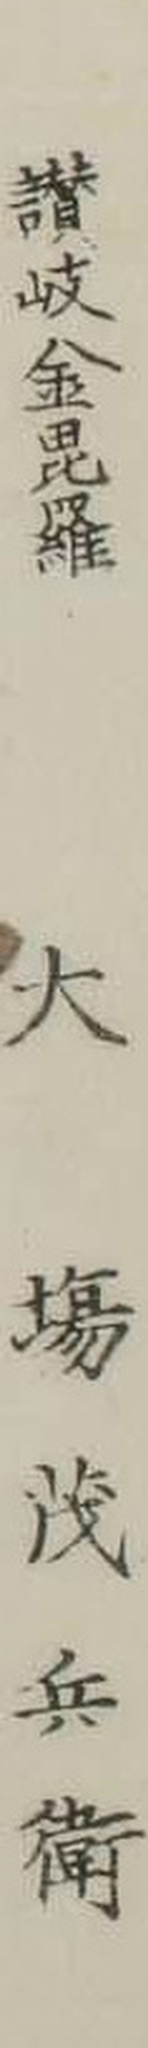讃岐金毘羅大塲屋茂兵衛
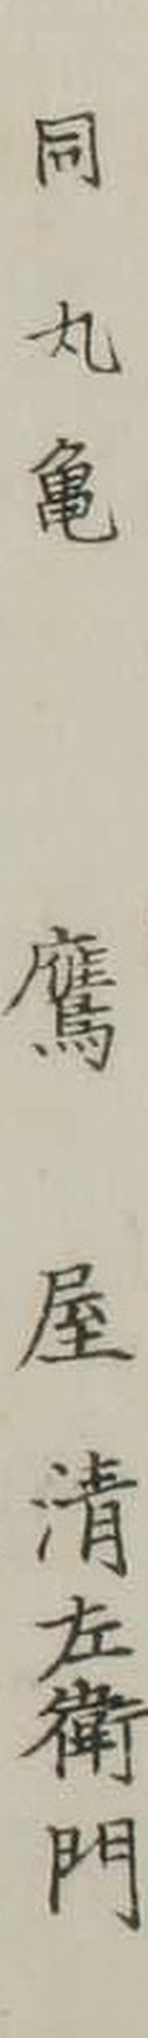同丸亀鷹屋清左衛門
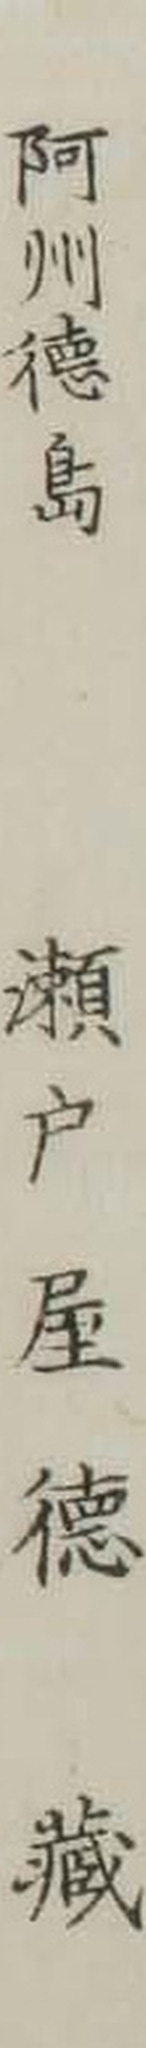阿州徳島瀬戸屋徳蔵
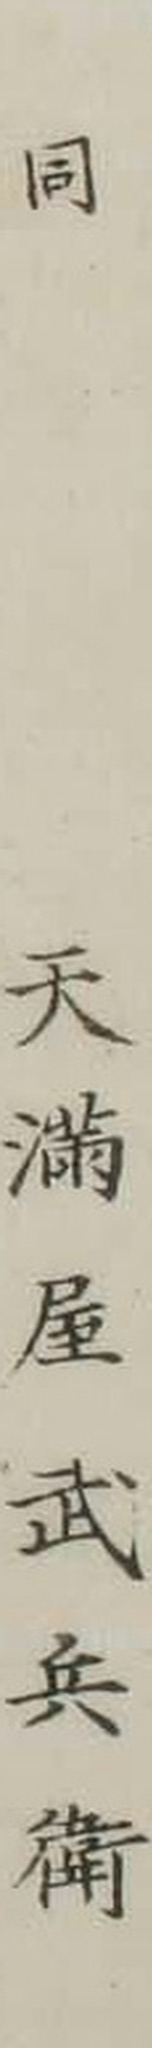同天満屋武兵衛
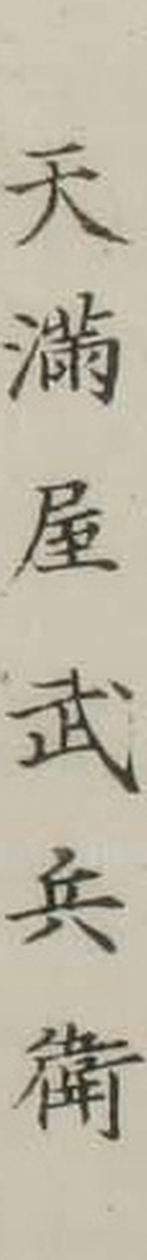同天満屋武兵衛
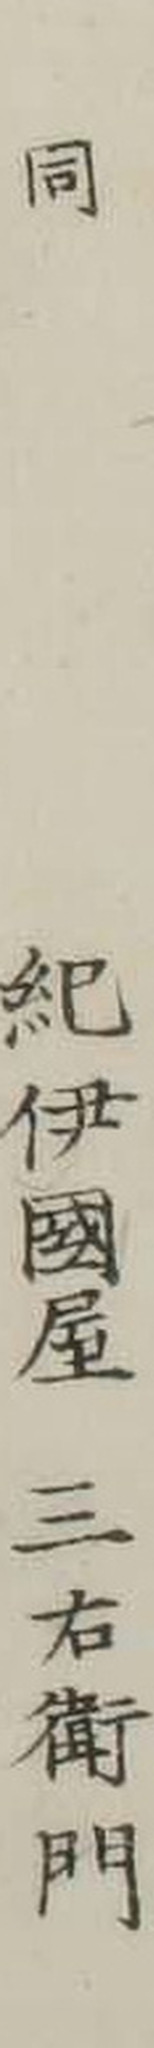同紀伊國屋三右衛門
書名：開化往来
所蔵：東京学芸大学教育コンテンツアーカイブ
